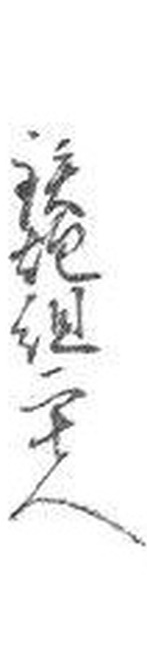鉄炮組二十人
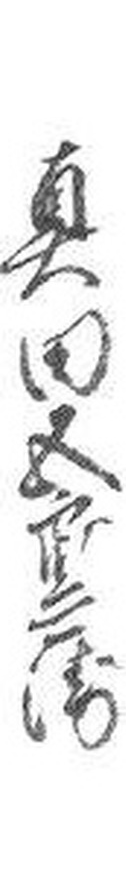真田五郎兵衛
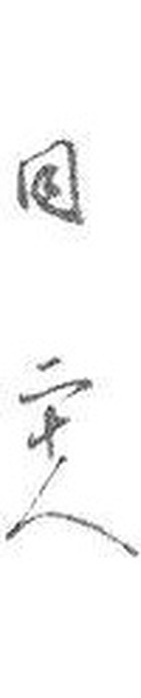同二十人
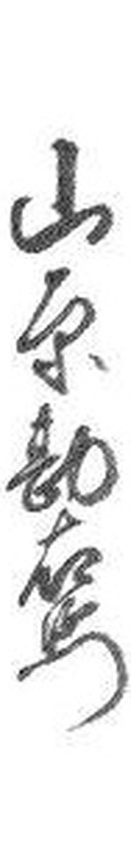山原勘右衛門
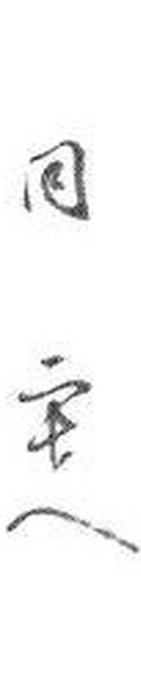同二十人
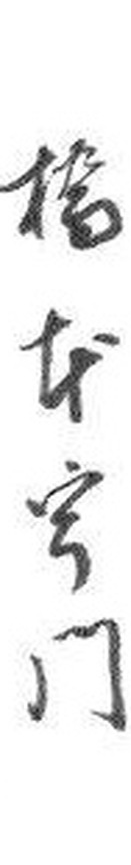橋本宇門
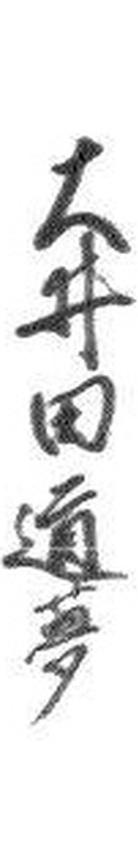大井田道夢
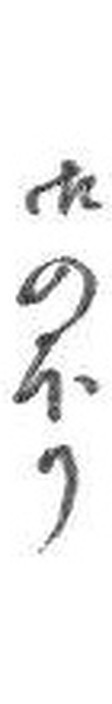御のほり
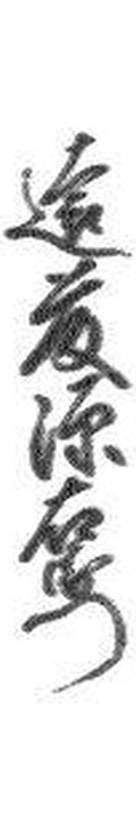遠藤源右衛門
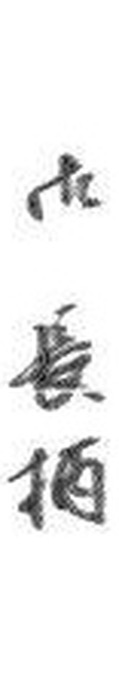御長柄
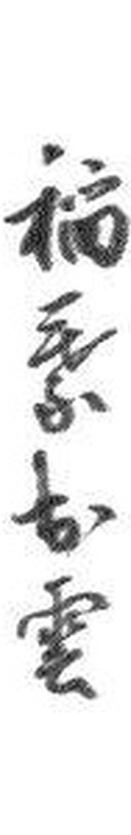稲葉出雲
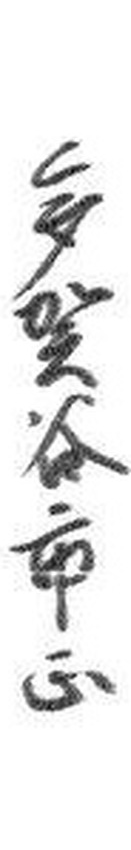多賀谷市正
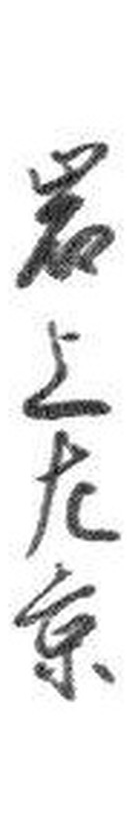岩上左京
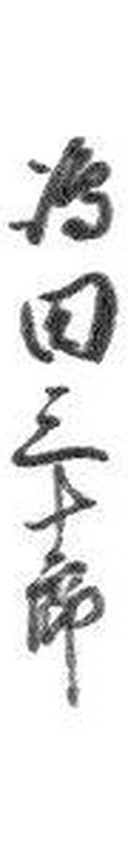嶋田三十郎
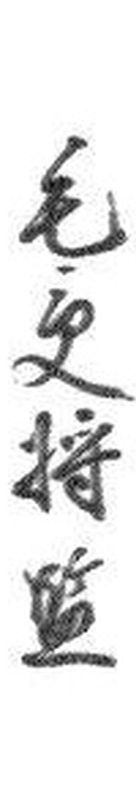毛受将監

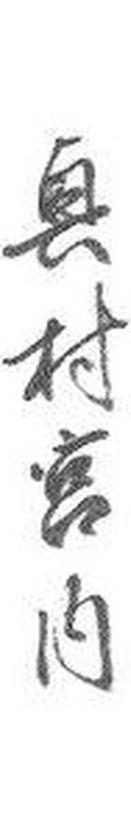奥村宮内
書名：家譜 四 忠昌公 従寛永七年到正保四年
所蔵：福井県文書館 Fukui Prefectural Archives
